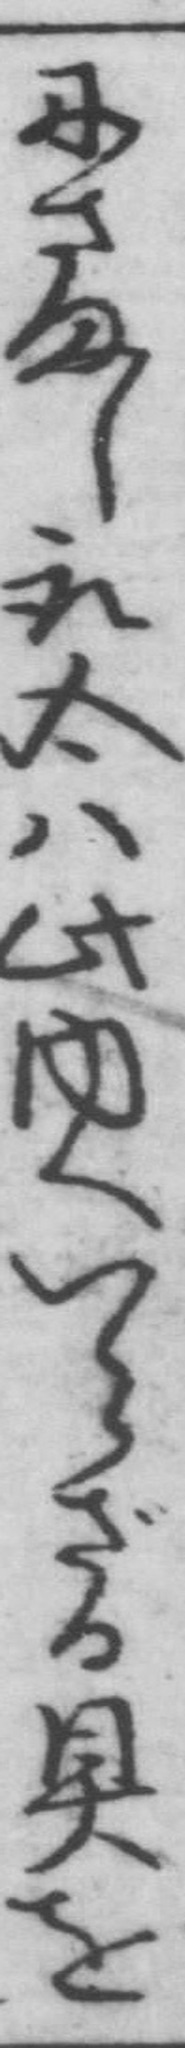にさまし取合ハ内へいらざる具を
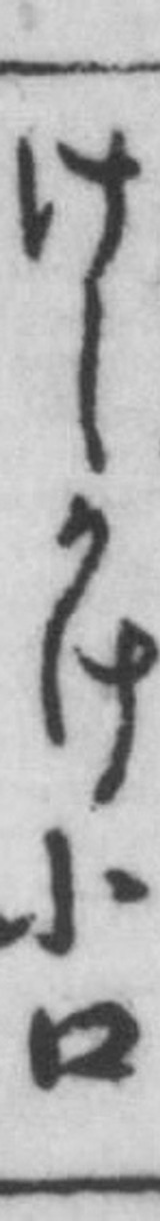けしかけ小口
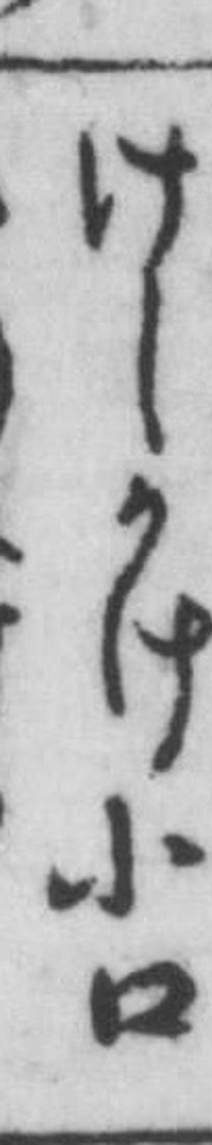けしかけ小口
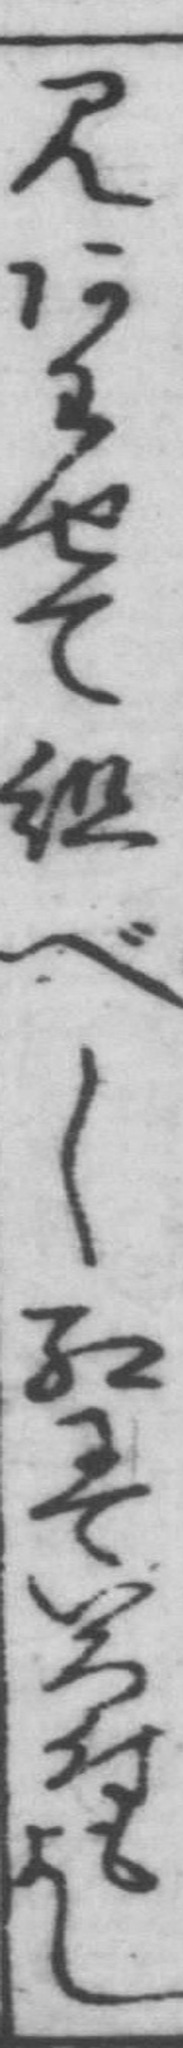見あわせて組べし紅していろ付もよし
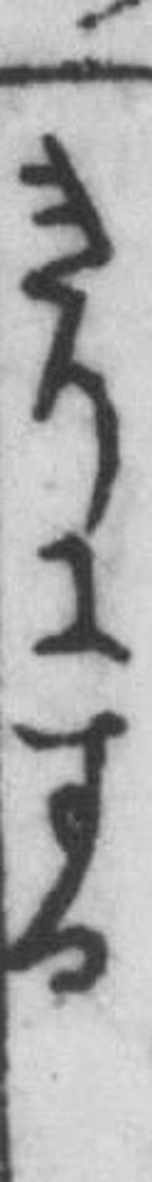きりにする
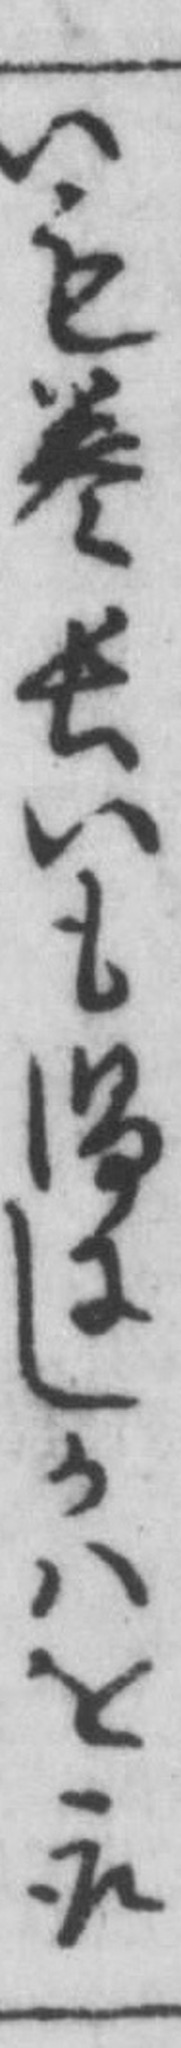いセ巻長いも湯にしかハを取
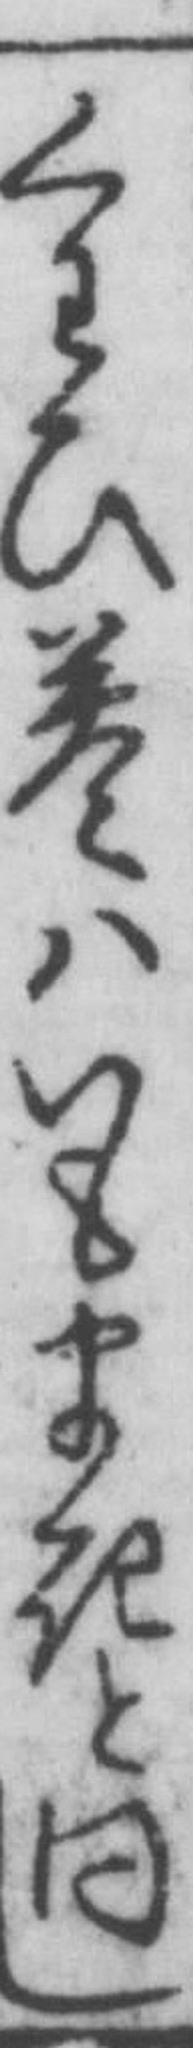くわひ巻ハいもまきと同し
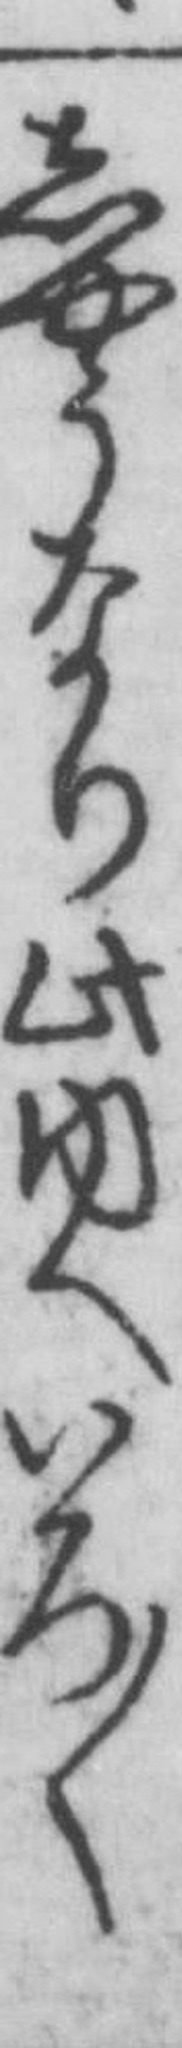しやうゆなりうちへいろ〳〵
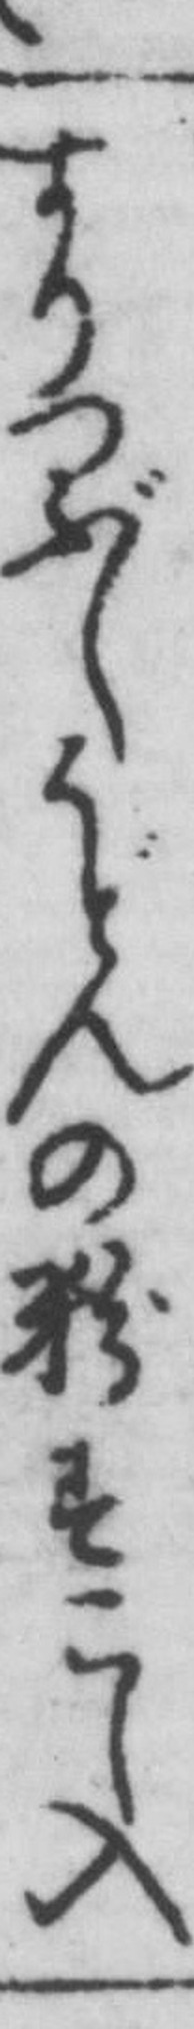すりつぶしうどんの粉すこし入
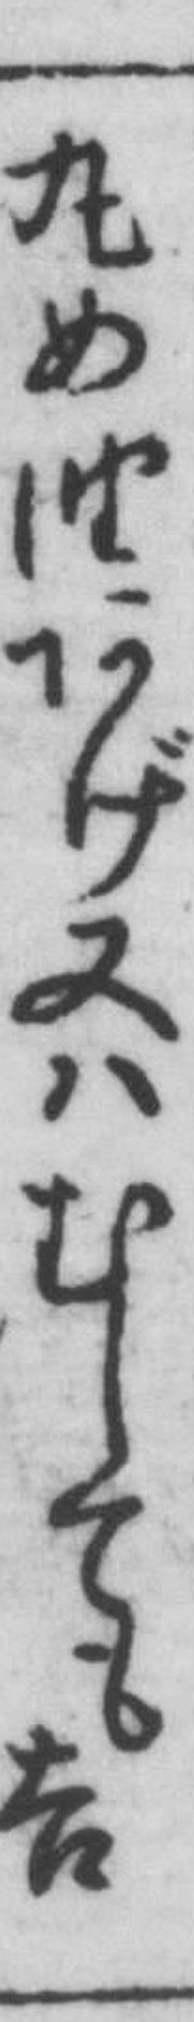丸め油あげ又ハむしても吉
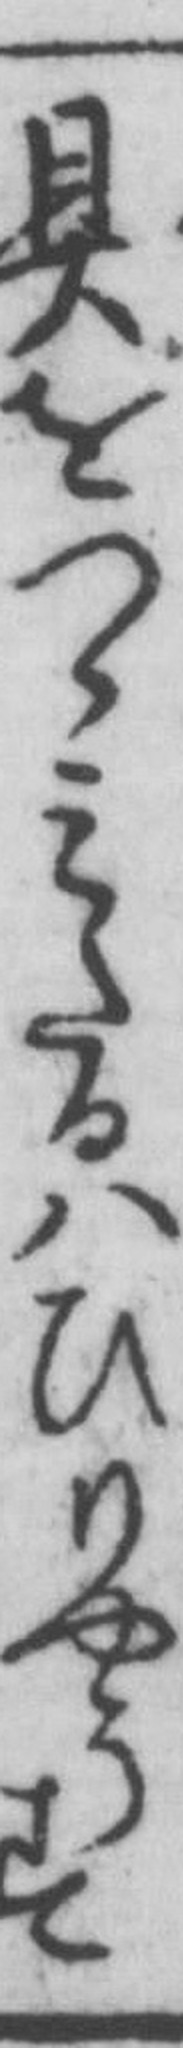具をつゝミたるハしりやうす
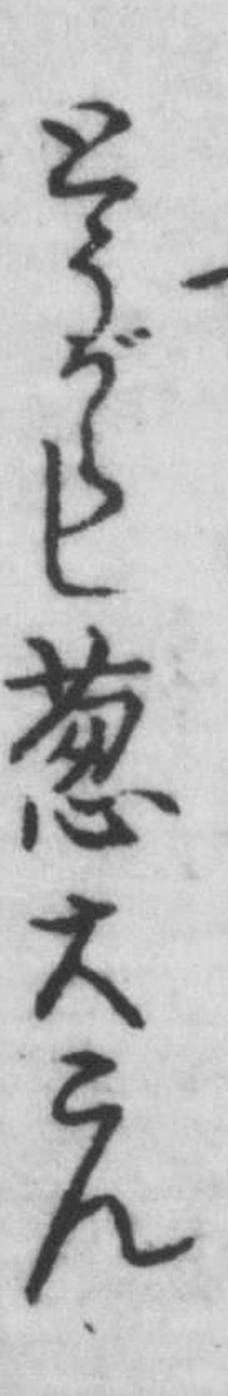とうがらし葱大こん
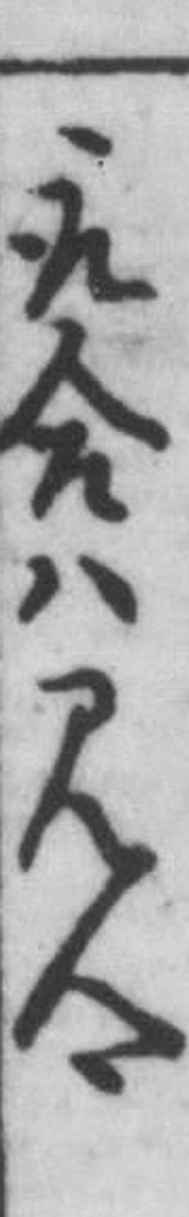取合ハ見合
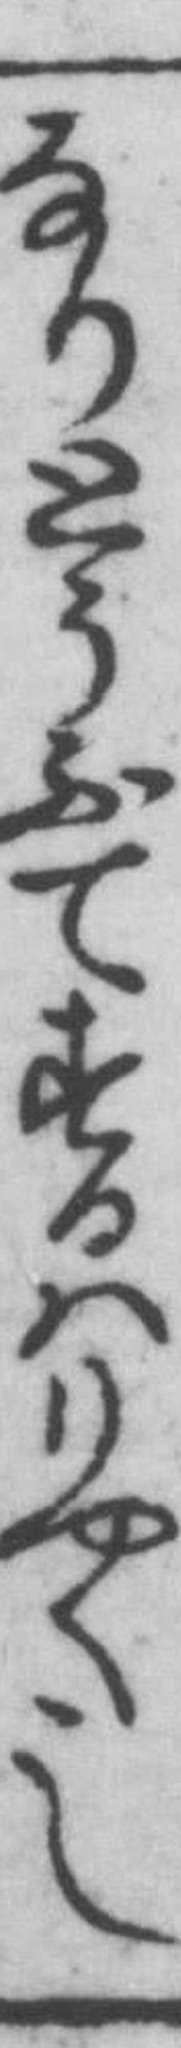なりとうふてするハりやし

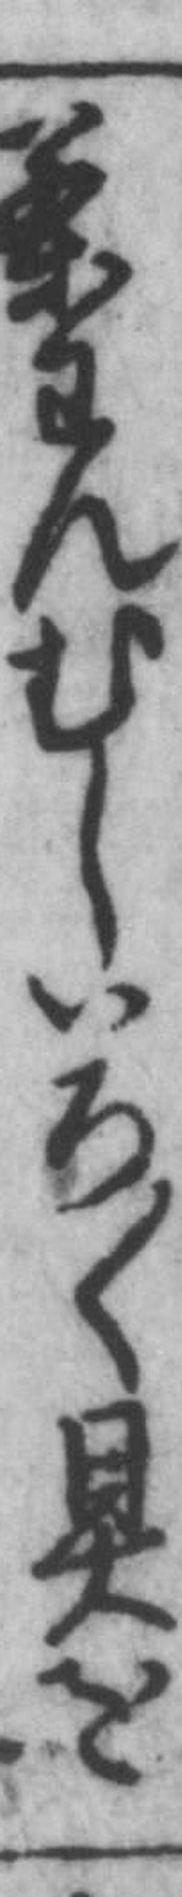茶わんむしいろ〳〵具を
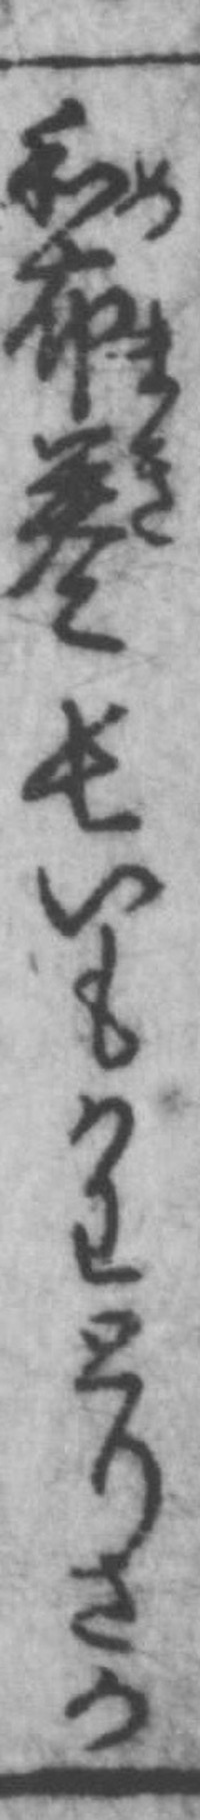和布巻長いもかわとりさか
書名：料理献立抄
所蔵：大阪府立大学学術情報センター 国文学研究資料館
